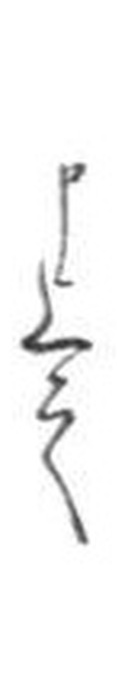申上之
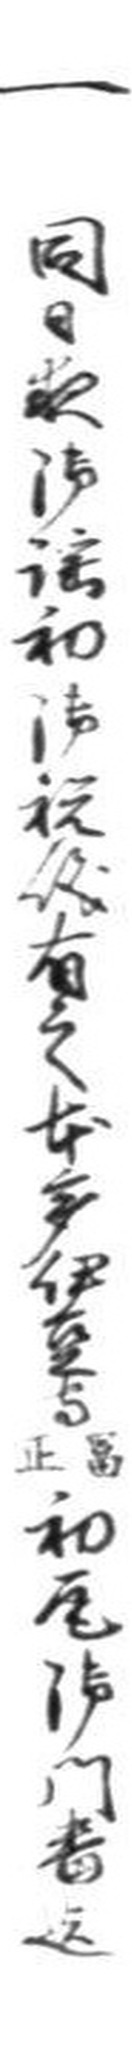一同日夜御謡初御祝儀有之本多伊豆守冨正初瓦御門番迄
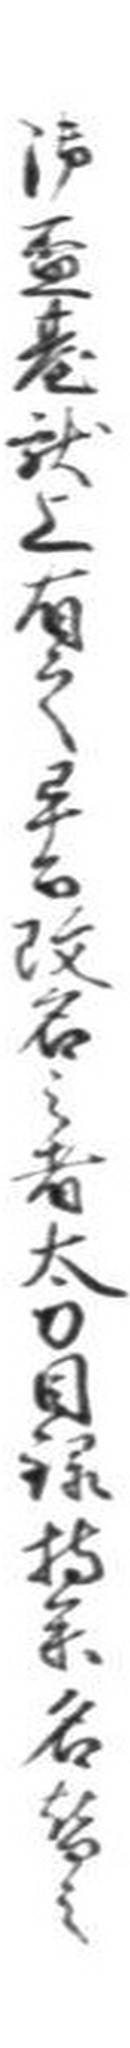御盃臺献上有之畢而改名之者太刀目録持参名替之
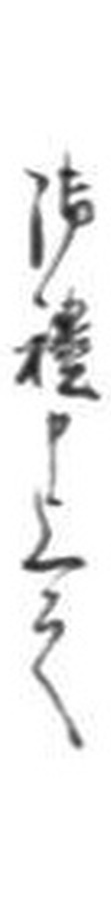御礼申上之
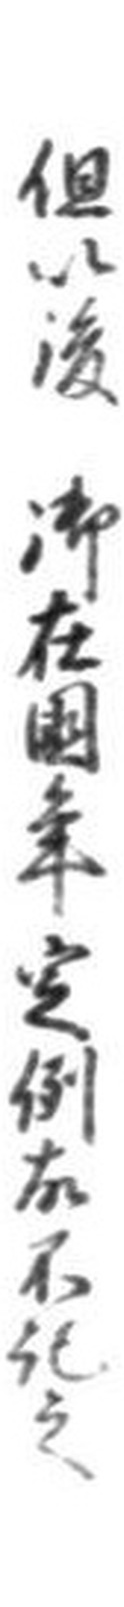但以後御在国年定例故不記之
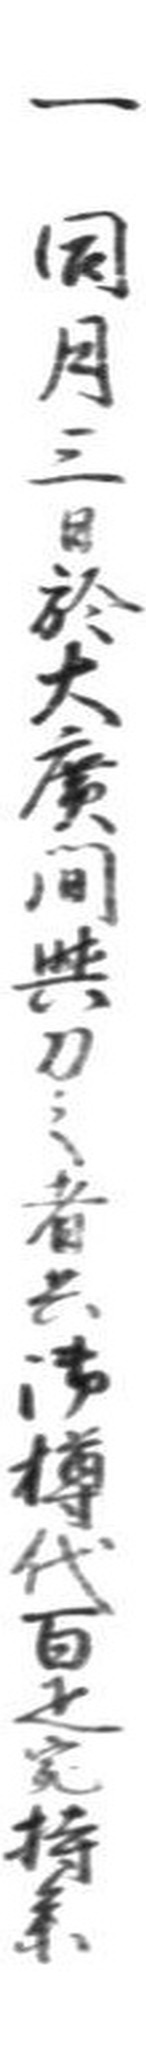一同月三日於大広間与力之者共御樽代百疋宛持参
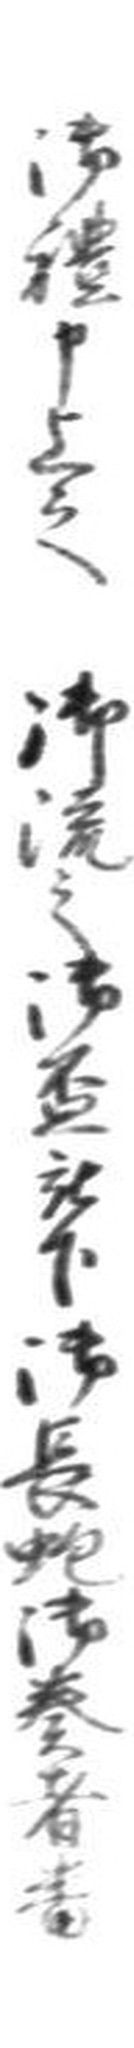御礼申上之御流之御盃被下御長蚫御奏者番
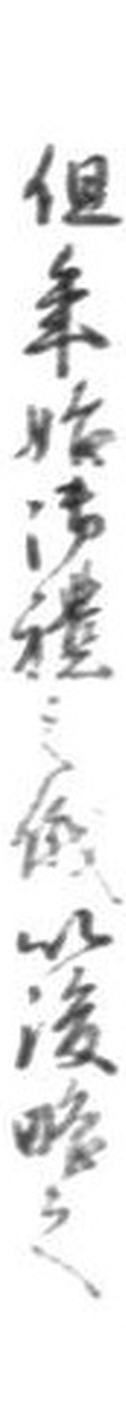但年始御礼之儀以後略之
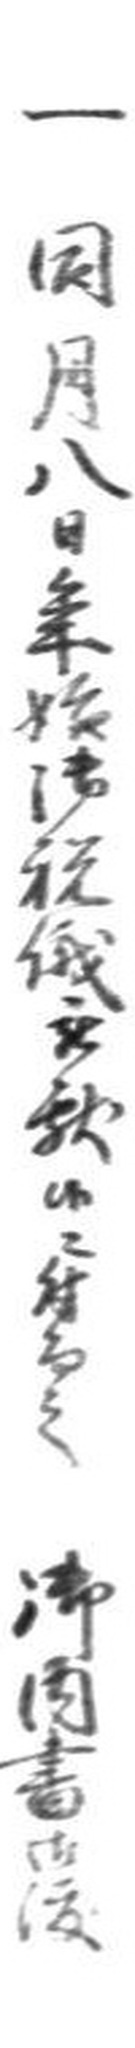一同月八日年始御祝儀被献候ニ付而之御内書御渡
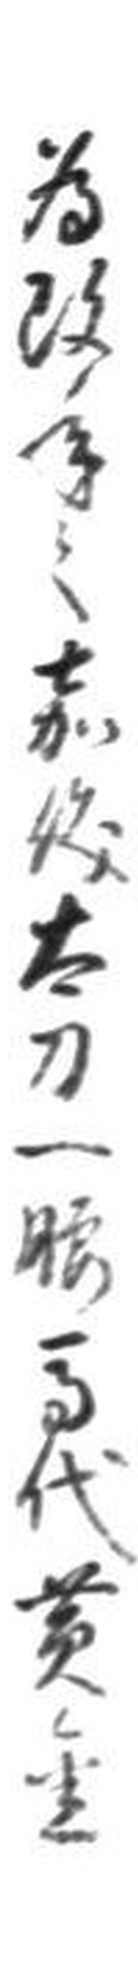為改年之嘉儀太刀一腰馬代黄金
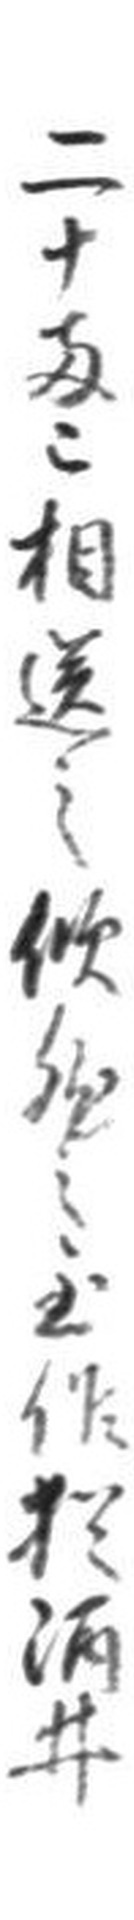二十両被相送之欣然之至候猶酒井

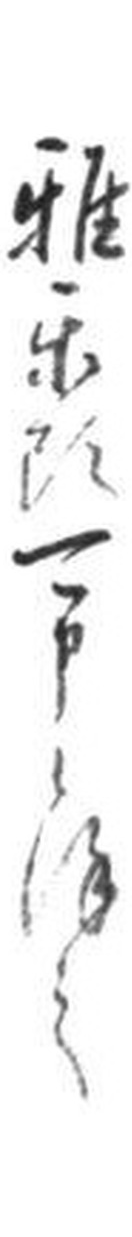雅楽頭可申候謹言
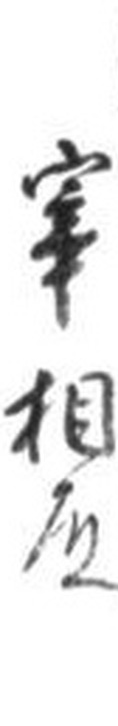宰相殿
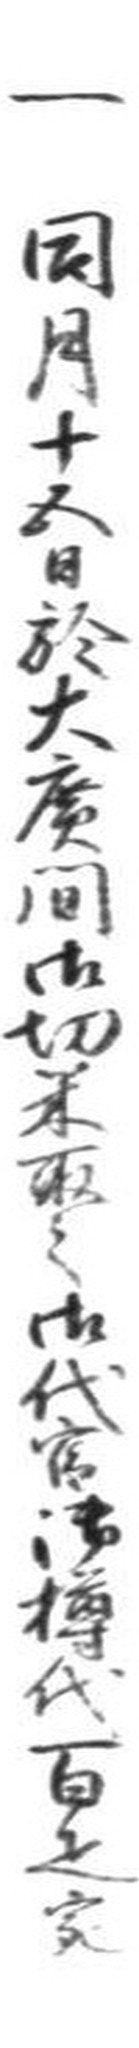一同月十五日於大広間御切米取之御代官御樽代百疋宛
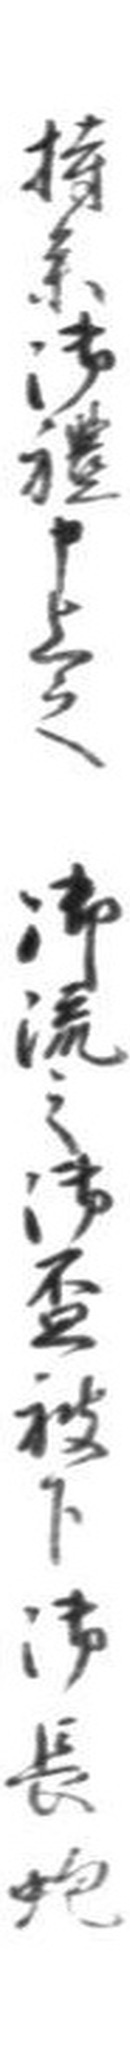持参御礼申上之御流之御盃被下御長蚫
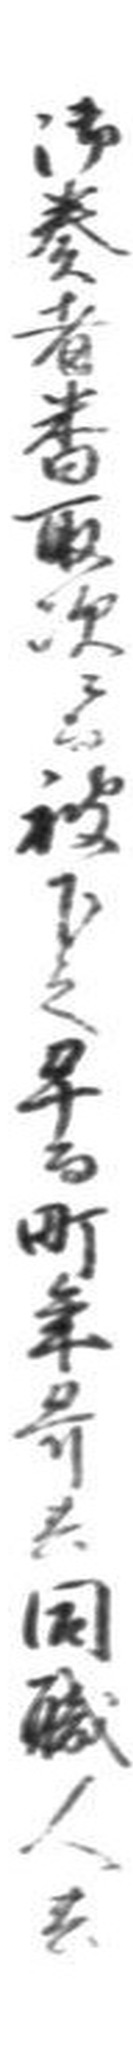御奏者番取次ニ而被下之畢而町年寄共同職人共
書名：家譜 三 忠昌公 従慶長八年到寛永六年
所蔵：福井県文書館 Fukui Prefectural Archives
